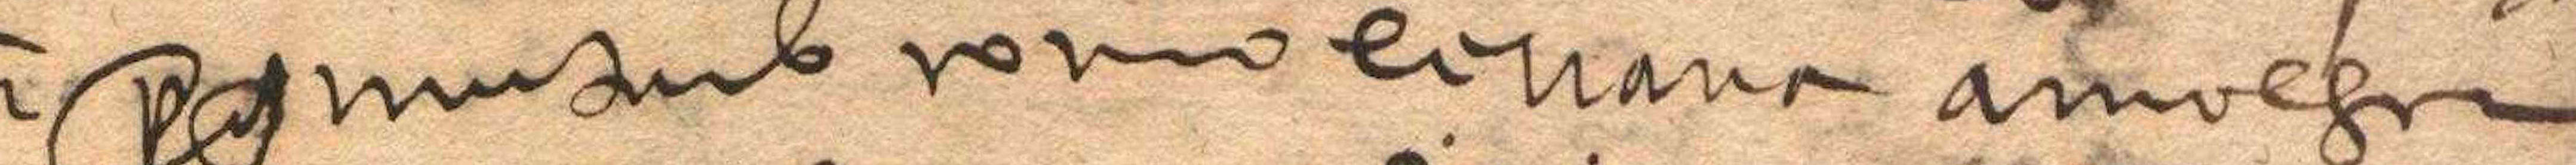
item p̄gumtado como leuaua a molher
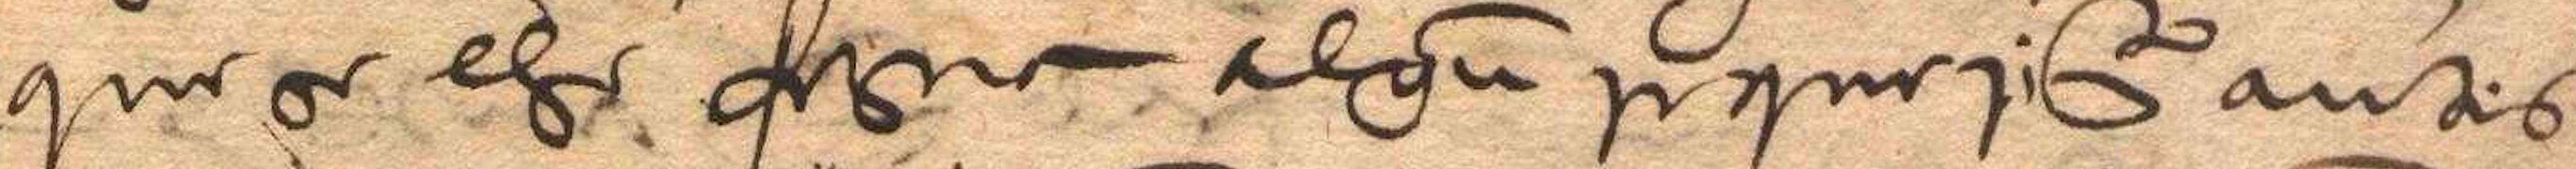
que se lhe fezera algū requerimto antes
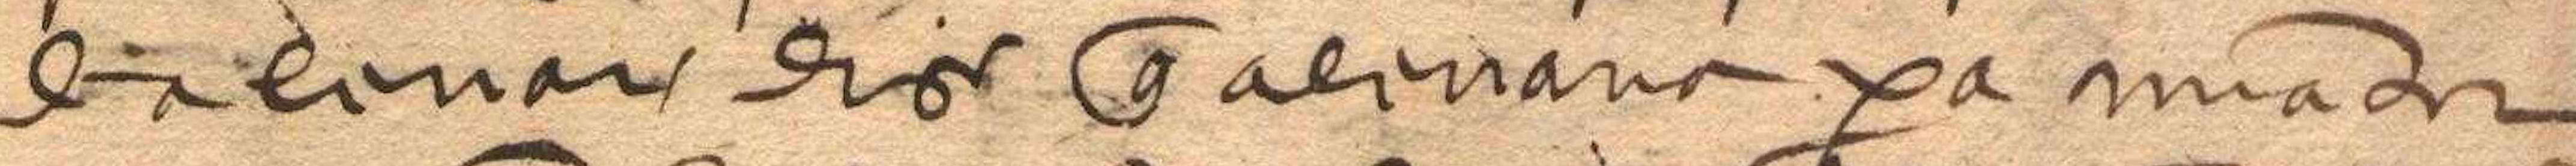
de a leuar/ dise q̄ a leuaua ꝑa a māter
